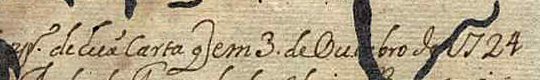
p.o de huā carta q̄ em 3. de Ou_bro de 724
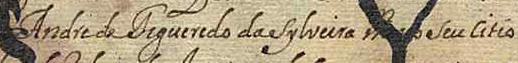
Andre de Figueredo da Sylveira _o seu citio
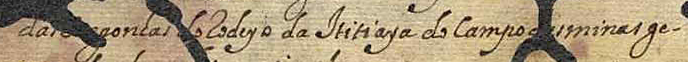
das C_gonhas do Rodeyo da Ititiaya do Campo _s minas ge
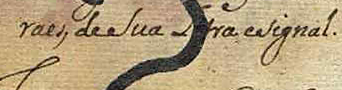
raes, de Sua L_tra e signal.
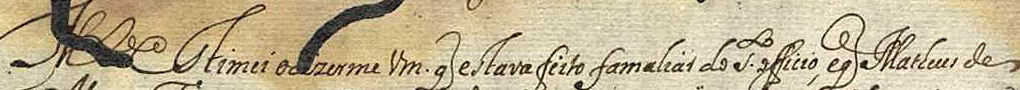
Mto Estimei o dizerme Vm. q̄ estava feito famaliar do s.to officio, e q̄ Matheus de
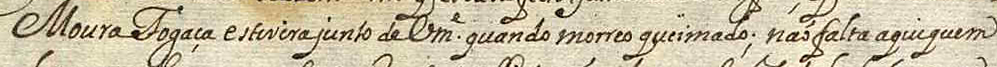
Moura Fogaça estivera junto de Vm.e quando morreo queimado; não falta aqui quem
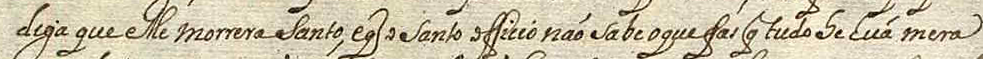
diga que elle morrera Santo, e q̄ o Santo officio naõ sabe o que fas q̄ tudo he huā mera
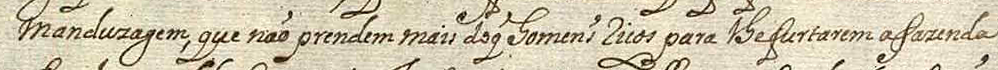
manduzagem, que naõ prendem mais do q̄ homens Ricos para lhe furtarem a fazenda
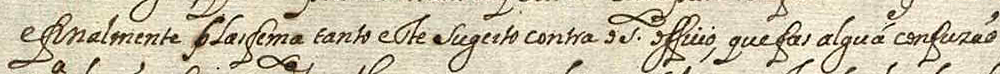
e finalmente blasfema tanto este sugeito contra o s.to officio, que fas alguā confuzaõ
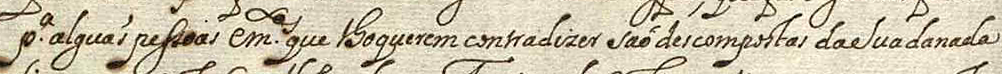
p.a alguas̄ pessoas e m.tas que lho querem contradizer saõ descompostas da Sua danada
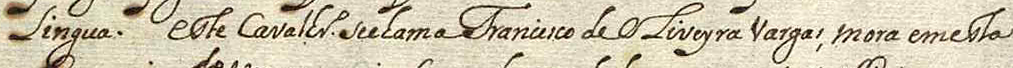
Lingua. este Cavalhr.o se chama Francisco de OLiveyra Vargas, mora em esta
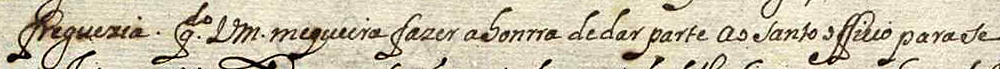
freguezia. q.do Vm. me queira fazer a honrra de dar parte ao santo officio para se
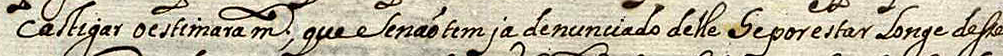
castigar o estimara mto; que se naõ tem ja denunciado delle he por estar Longe desse
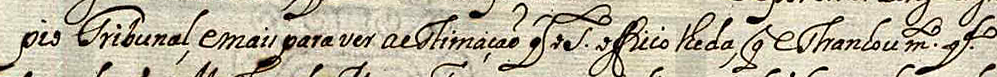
pio Tribunal, e mais para ver a estimaçaõ q̄ o s.to officio lhe da, q̄ estranhou m.to q.do
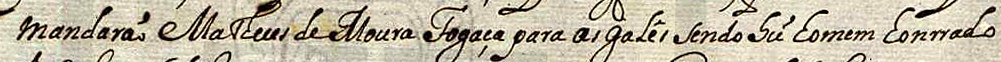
mandaraõ Matheus de Moura Fogaça para as galés sendo hū homem honrrado
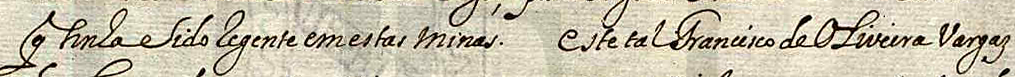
q̄ tinha Sido Regente em estas minas. este tal Francisco de OLiveira Vargas
